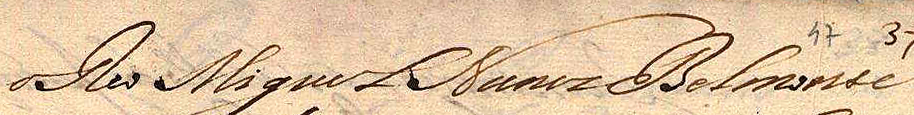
o Reo Miguel Nunez Belmonte
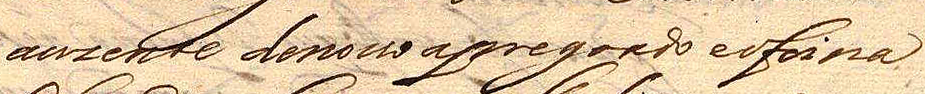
auzente de nouo apregoado e o foi na
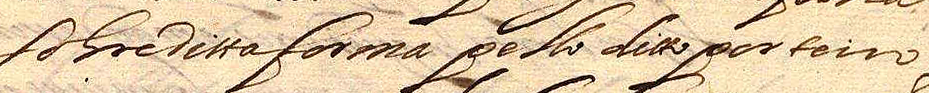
sobreditta forma pello ditto porteiro
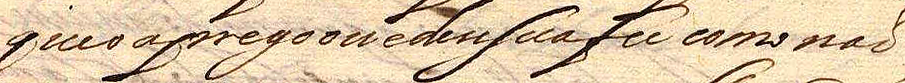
que o apregoou e deu sua fee como naõ
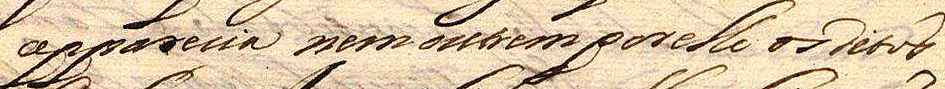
apparecia nem outrem por elle os ditos
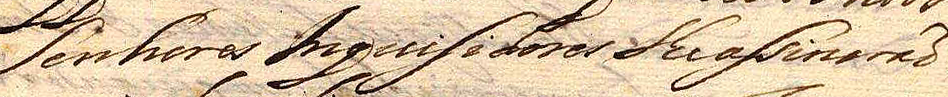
Senhores Inquisidores lhe assinaraõ
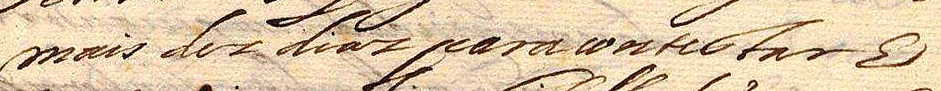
mais dez diaz para contestar E
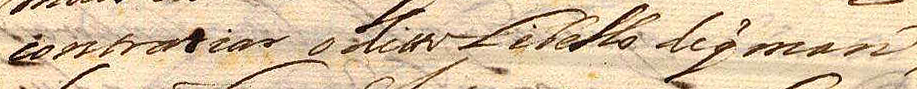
contrariar o ditto Libello de q̄ man
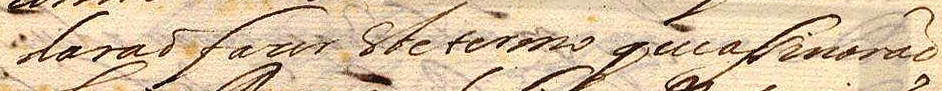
daraõ fazer este termo que assinaraõ
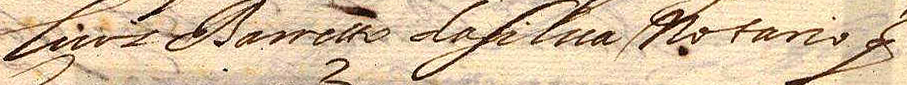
Luiz Barretto da Silua Notario q̄
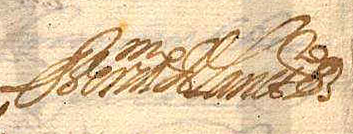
Berthmo de Lanctre
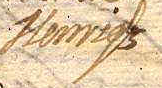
Henriq̄s
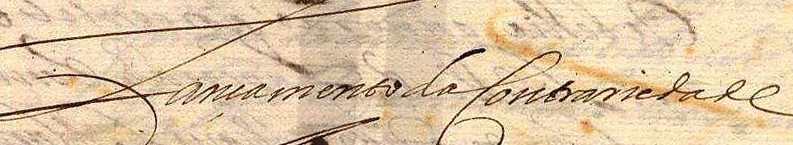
Lançamento da Contrariedade
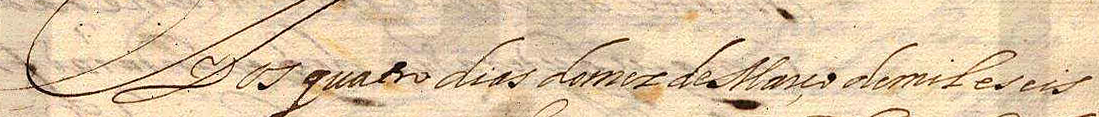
Aos quatro dias do mez de Março de mil e seis
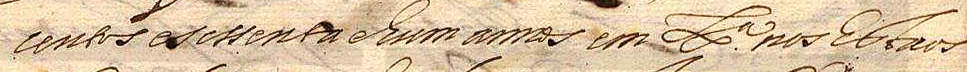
centos e sessenta e hum annos em Lxa nos Estaos
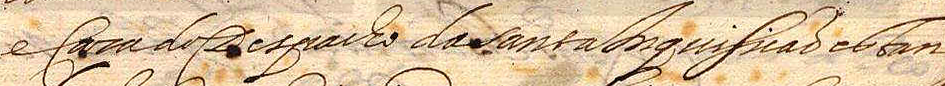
e Caza do Despacho da Santa Inquisiçaõ estan
